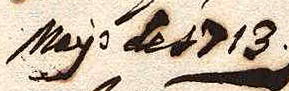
Mayo de 1713.
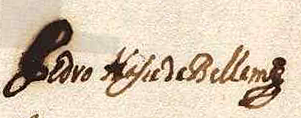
Pedro Hasse de Bellem
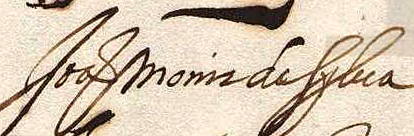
Joaõ moniz da sylua
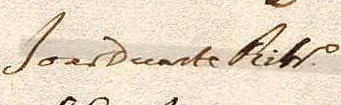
Ioaõ Duarte Ribr.o
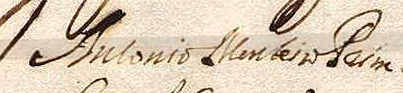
Antonio Monteiro Paim.
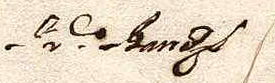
Fr.co Barreto
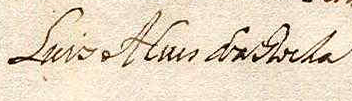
Luis Alues da Rocha
